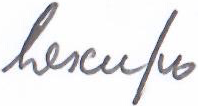вяхирь
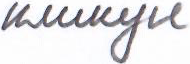кликун
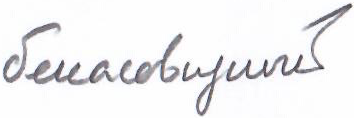бекасовидный
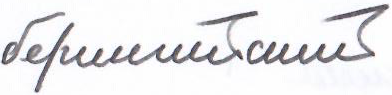берингийский
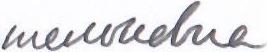теньковка
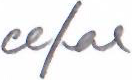серая
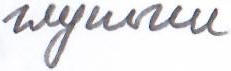глупыш
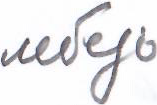лебедь
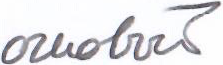очковый
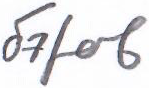бэров
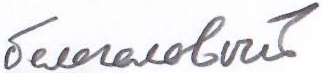белоголовый
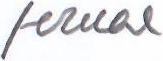речная
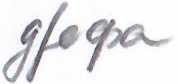дрофа
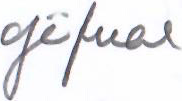озёрная
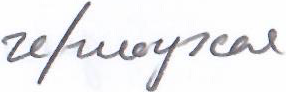черноухая
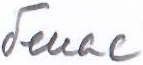бекас
